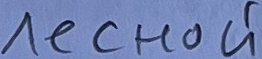лесной
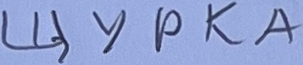щурка
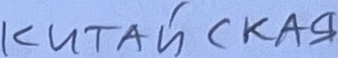китайская
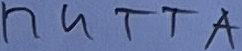питта
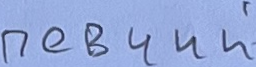певчий
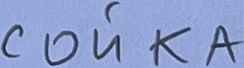сойка
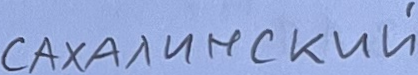сахалинский
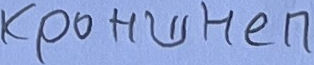кроншнеп
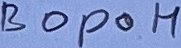ворон
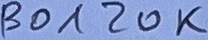волчок
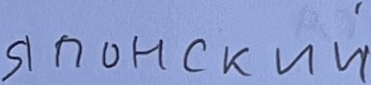японский
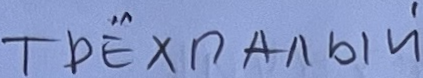трёхпалый
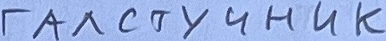галстучник
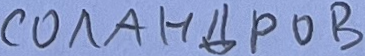соландров
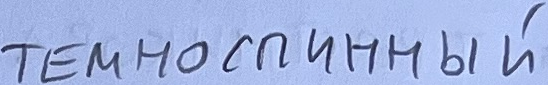темноспинный
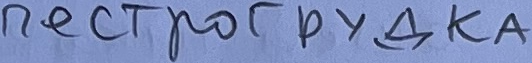пестрогрудка
